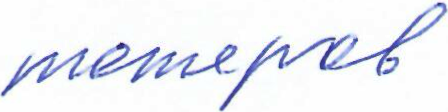тетерев
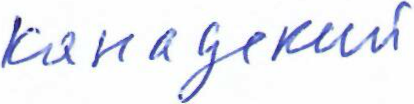канадский
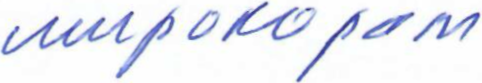широкорот
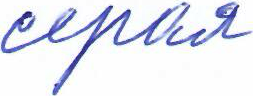серая
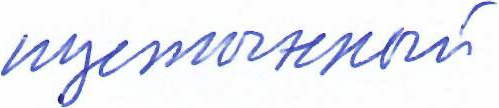пустынный
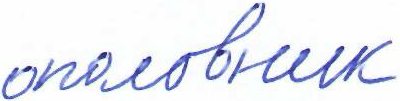ополовник
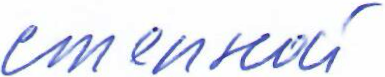степной
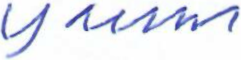улит
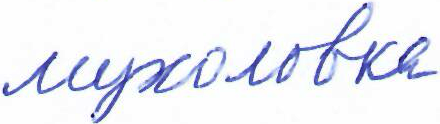мухоловка
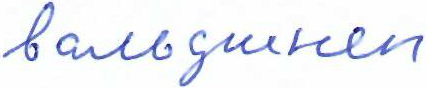вальдшнеп
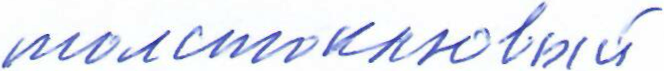толсто клювый
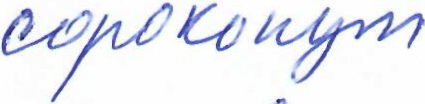сорокопут
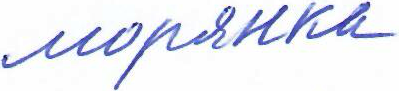морянка
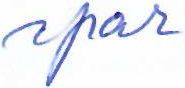грач
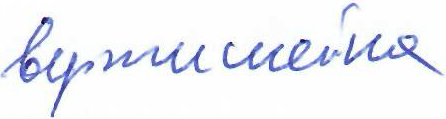вертишейка
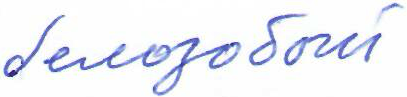белозобый
